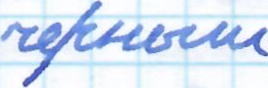черныш
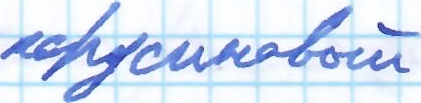парусиновый
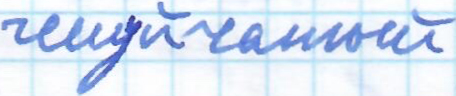чешуйчатый
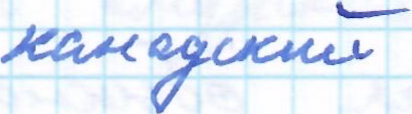канадский
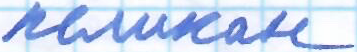пеликан
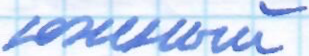южный
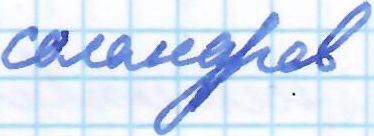соландров
